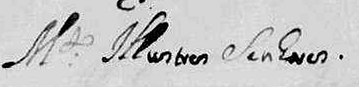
Mt.o Illustres Senhores.
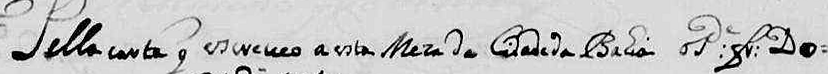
Pella carta q̄ escreueo a esta Meza da Cidade da Bahia o P:e fr: Do
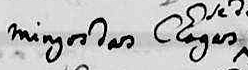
mingos das Chagas
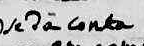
se dá conta
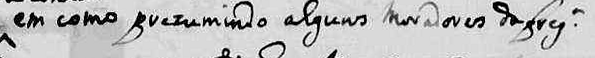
em como prezumindo alguns moradores da freg.a
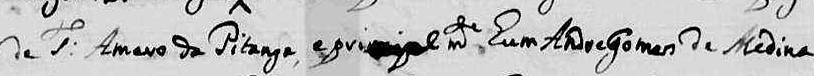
de s.to Amaro da Pitanga, e principalmte. hum Andre Gomes de Medina
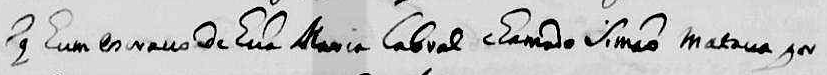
q̄ hum escrauo de hūa Maria Cabral chamado Simaõ mataua por
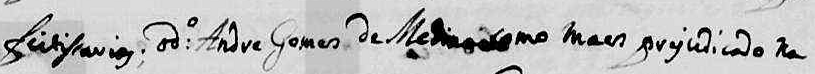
feitissarias; o d:o Andre Gomes de Medina como maes prejudicado na
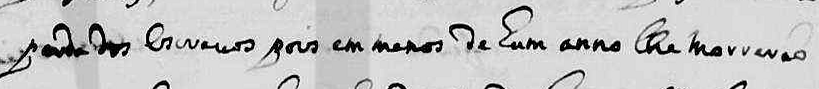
perda dos escrauos pois em menos de hum anno lhe morreraõ
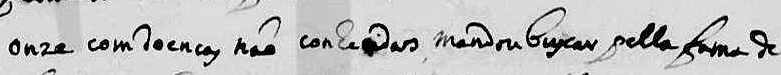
onze com doenças naõ conhecidas, mandou buscar pella fama de
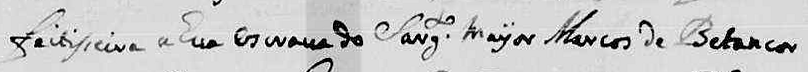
feitisseira a hua escraua do Sarg.to mayor Marcos de Betancor
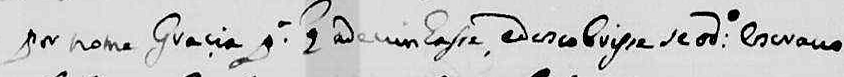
por nome Gracia p.a q̄ adeuinhasse, e descobrisse se o d:o escrauo
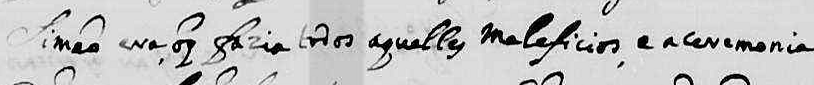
Simão era, o q̄ fazia todos aquelles maleficios, e a ceremonia
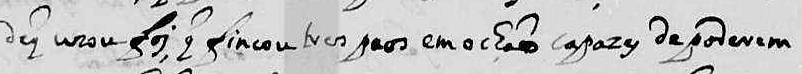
de q̄ uzou foj, q̄ fincou tres paos em o chaõ capazes de poderem
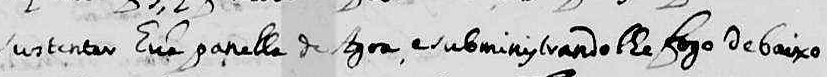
sustentar huā panella de Agoa, e subministrandolhe fogo debaixo
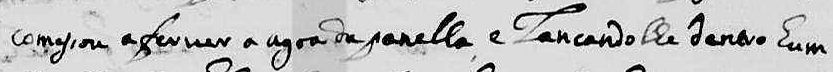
comessou a feruer a agoa da panella, e Lançandolhe dentro hum
